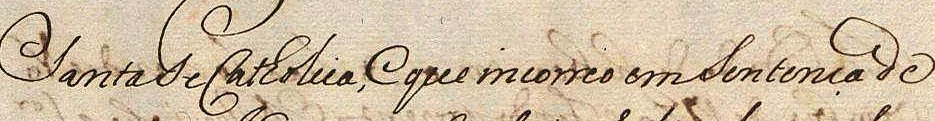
Santa Fe Catholica, e que incorreo em Sentença de
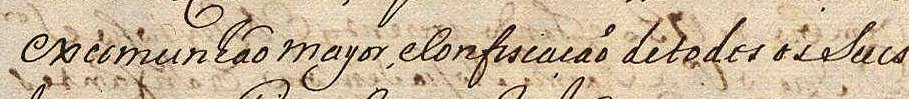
excomunhão mayor, e Confiscaçaõ de todos os Seus
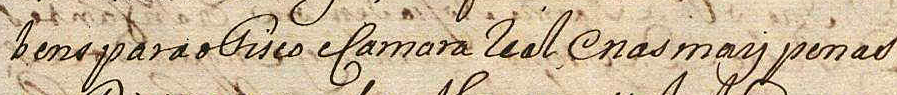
bens para o Fisco e Camara Real, e nas mais penas
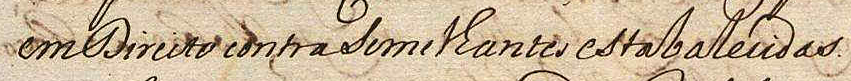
em Direito contra Semelhantes estabalecidas.
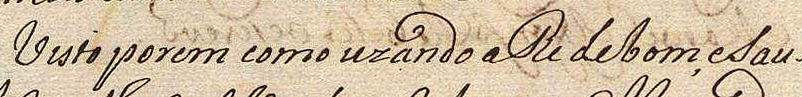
Visto porem como uzando a Re de bom, e Sau
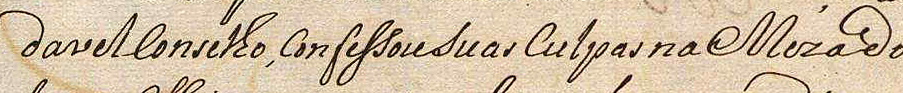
davel Conselho, Confessou Suas Culpas na Meza do
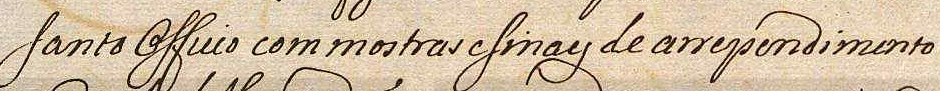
santo Officio com mostras e sinaes de arrependimento
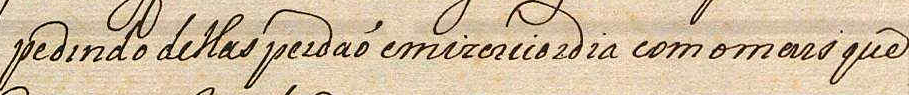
pedindo dellas perdaõ e mizericordia com o mais que
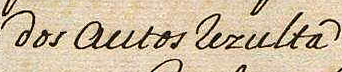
dos autos Rezulta.
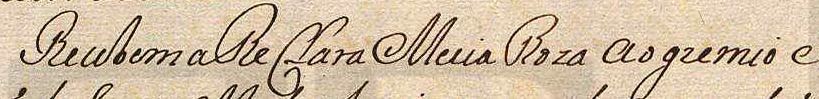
Recebem a Re CLara Mecia Roza ao gremio, e
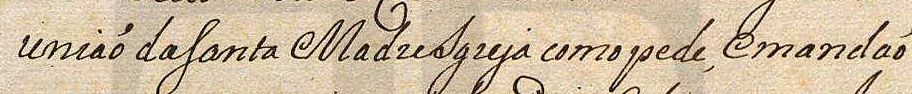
uniaõ da santa Madre Igreja como pede, e mandaõ
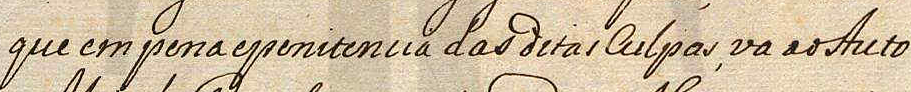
que em pena e penitencia das ditas Culpas, va ao Auto
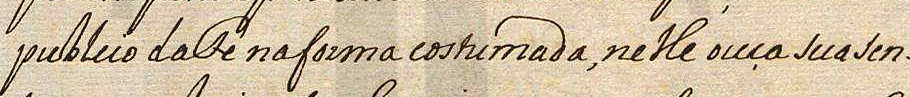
publico da Fe na forma costumada, nelle ouça sua sen
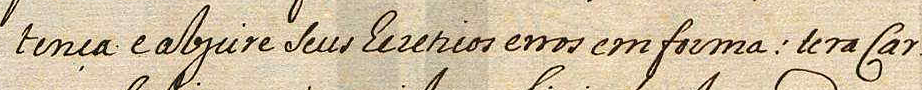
tença, e abjure seus hereticos erros em forma: tera Car
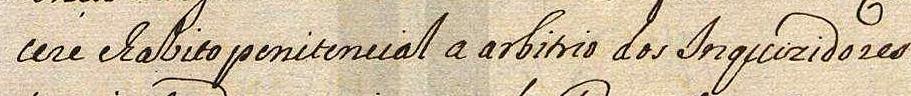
cere e habito penitencial a arbitrio dos Inquizidores:
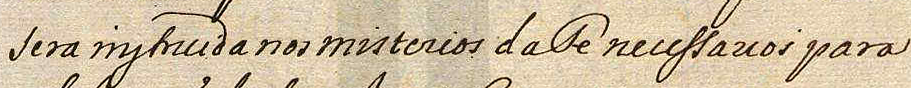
sera instruida nos misterios da Fé necessarios para
